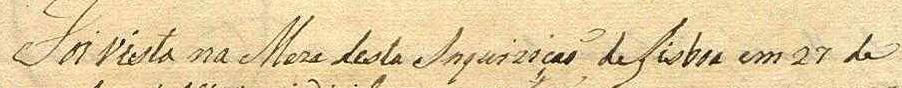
Foi vista na Meza desta Inquiziçaõ de Lisboa em 27 de
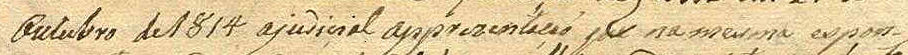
Outubro de 1814 a judicial apprezentaçaõ que na mesma espon
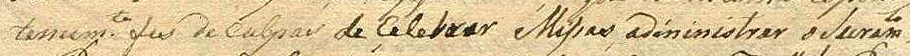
taneam.te fes de culpas de Celebrar Missas, administrar o Sacram.to
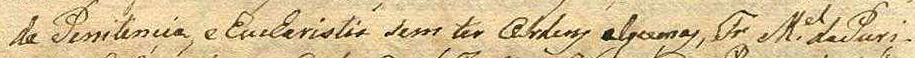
da Penitencia, e Eucharistia sem ter Ordens algumas, Fr M.el da Puri
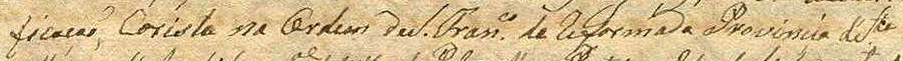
ficaçaõ Corista na Ordem de S. Fran.co da Reformada Provincia d'S.ta
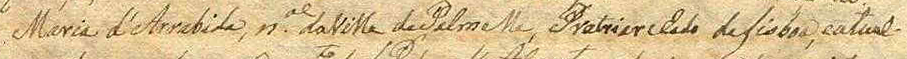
Maria d'Arrabida, n.al da Villa de Palmella, Pratriarchado de Lisboa, e atual
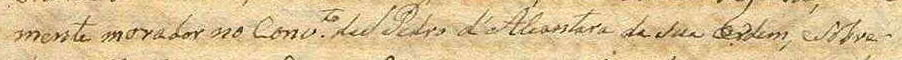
mente morador no Conv.to de S Pedro d'Alcantara da sua ordem, e sobre
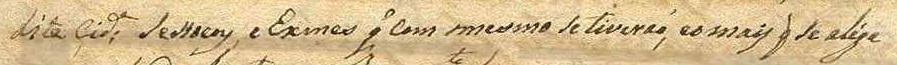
dita cid.e sessoens, e Exmes q̄ com o mesmo se tiveraõ, e o mais q̄ se aléga
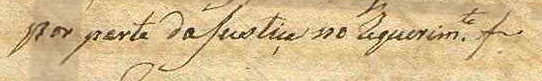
por parte da Justiça no Requerim.o f.
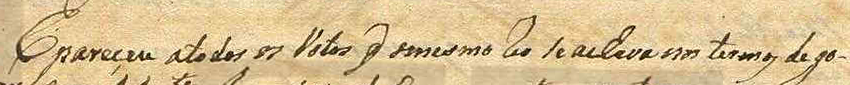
E pareceu a todos os Votos q̄ o mesmo Reo se achava nos termos de go
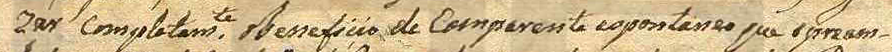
zar completam.te o beneficio de Comparente espontaneo que o pream
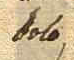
bolo,
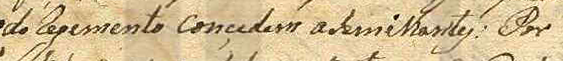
do Regemento conçedem a semilhantes: Por
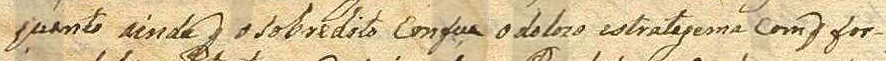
quanto ainda q̄ o sobredito confeça o dolozo estrategema com q̄ for
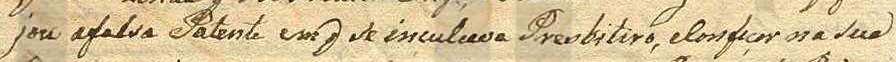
jou a falsa Patente em q̄ se inculcava Presbitiro, e confeçor na sua
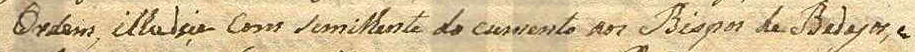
Ordem illudiu com semilhante documento aos Bispos de Badajos, e
